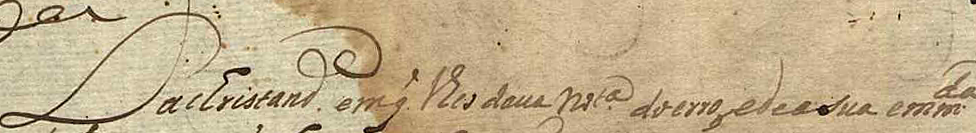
Da christand.e em q̄ lhes daua not.a do erro, e de a sua emm.da
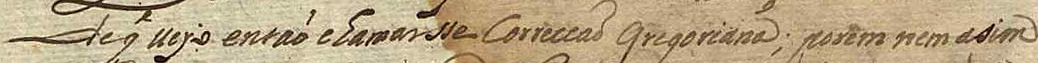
de q̄ ueyo entaõ chamarsse Correcçaõ Gregoriana; porem nem asim
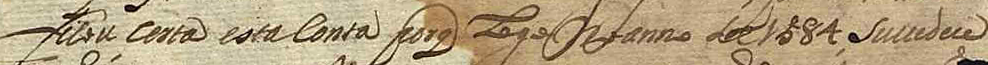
ficou certa esta conta porq̄ Logo no anno de 1584, succedece
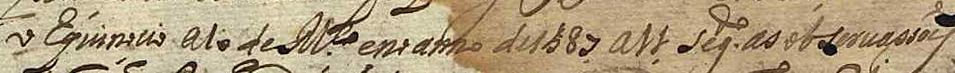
o Equinocio a 10 de M.co e no anno de 1587 a 11, seg.do as obseruassoẽs
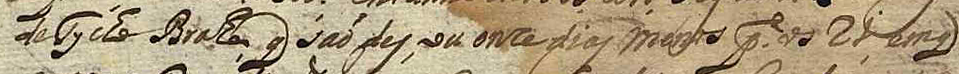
de Tycho Brahe, q̄ saõ des ou onze dias menos p.a os 21, em q̄
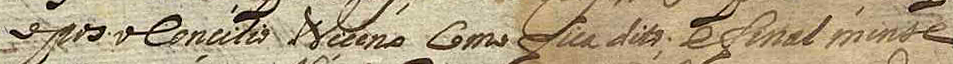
o pos o Concilio Niceno Como fica dito e finalmente
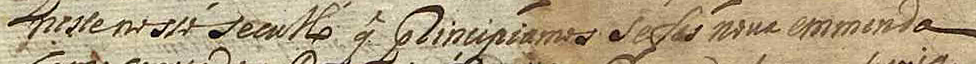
neste nosso secullo q̄ pRinçipiamos se fas noua emmenda
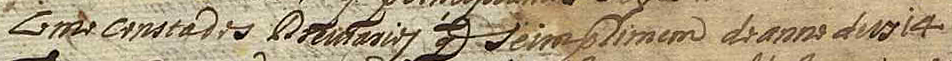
como consta dos Breuiarios q̄ se imprimem do anno de 17i4
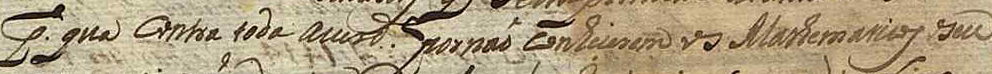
p.a que contra toda a uerd.e por naõ conhecerem os Mathematicos o seu
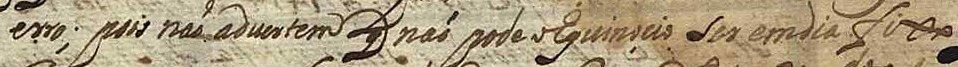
erro; pois naõ aduertem q̄ naõ pode o Equinocio ser em dia fixo
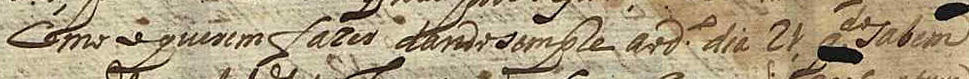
Como o querem fazer dando sempre ao d.o dia 21, q.do sabem
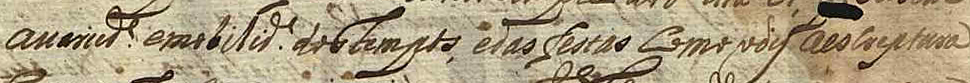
a uaried.e e mobilid.e dos tempos, e das festas Como o dis a escriptura
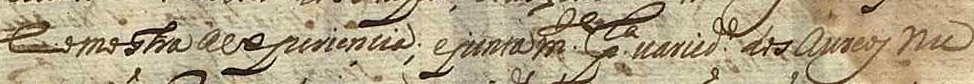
E o mostra a experiencia; e juntamte p.la uaried.e dos aureos nu
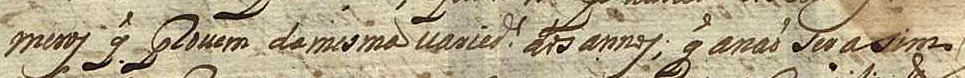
meros q̄ prouem da mesma uaried.e dos annos; q̄ a naõ ser asim
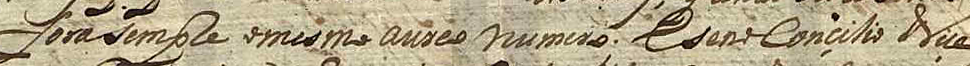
fora sempRe o mesmo aureo numero. E se no Concilio Nice
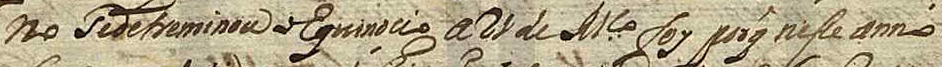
no se detreminou o Equinocio a 21 de M.co foy porq̄ nesse anno
